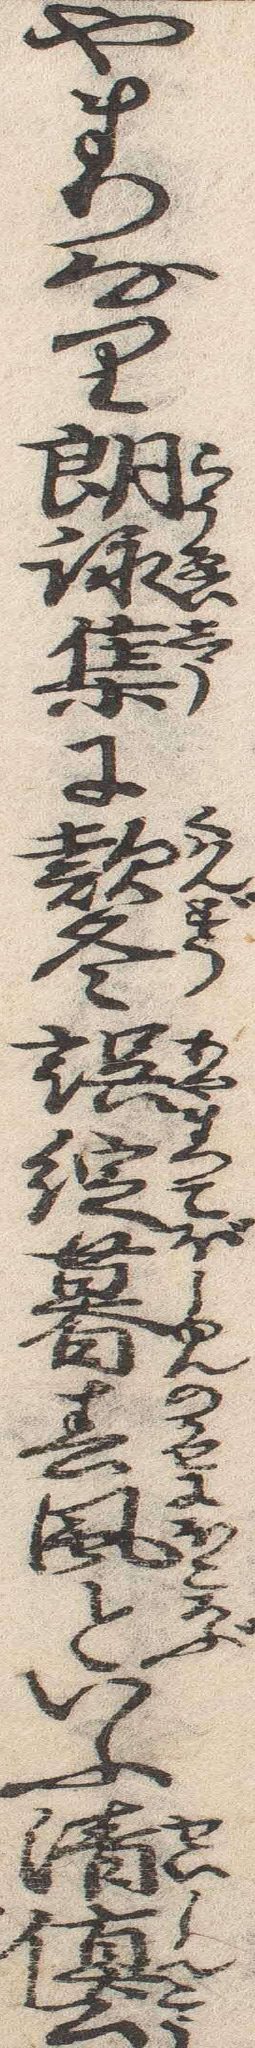やまりなり朗詠集に款冬誤綻暮春風といふ清慎公
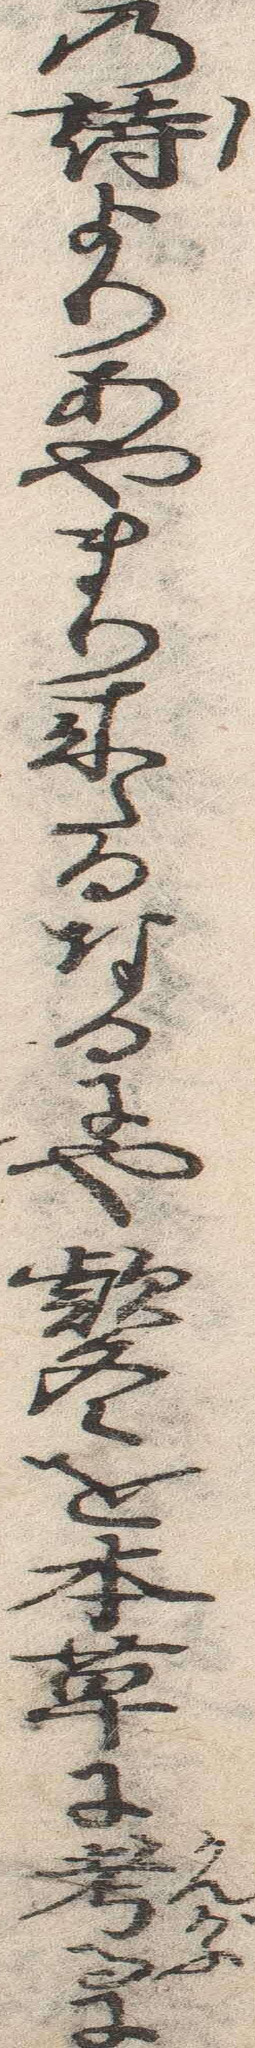の詩よりあやまり來たるなるにや款冬を本草に考るに
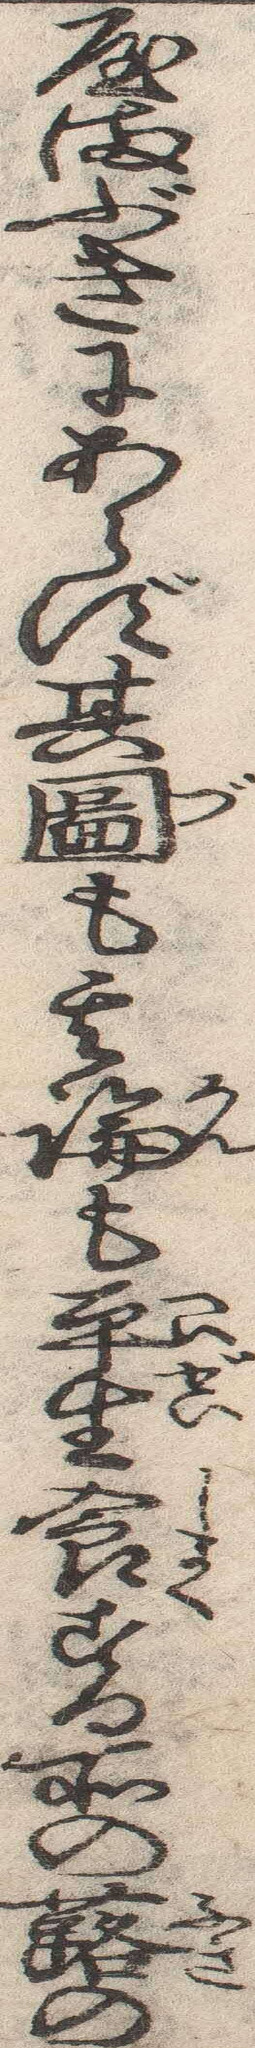やまぶきにあらず其圖も其論も平生食する所の蕗の
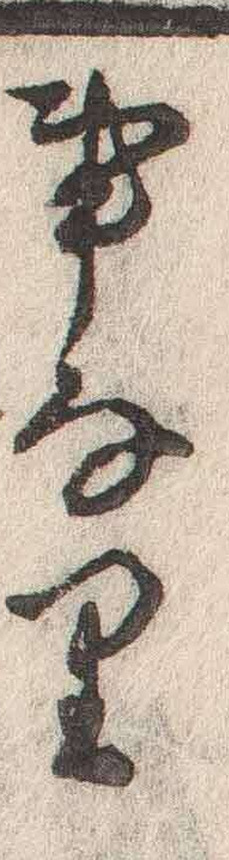事なり
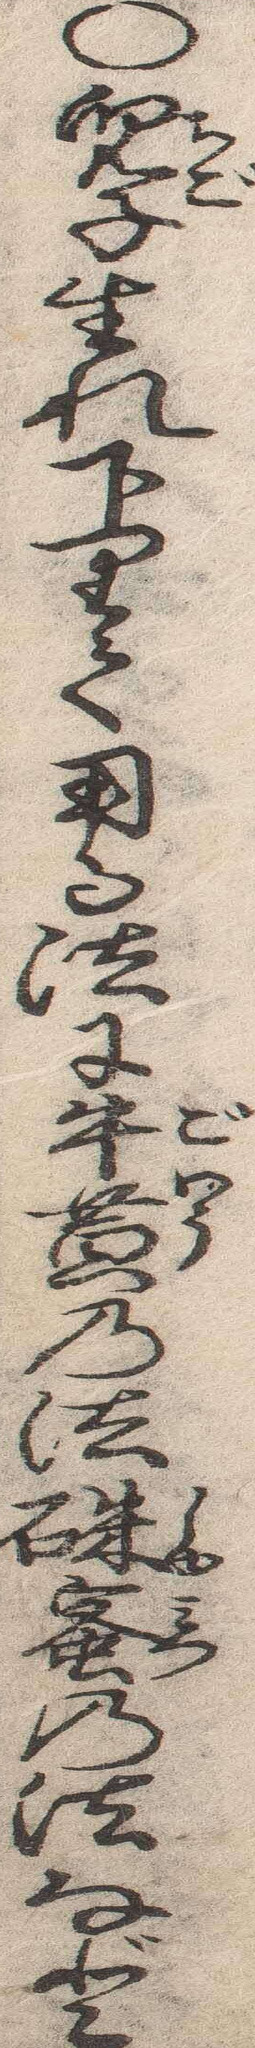◯児子生れ下りて用る法に牛黄の法硃蜜の法など

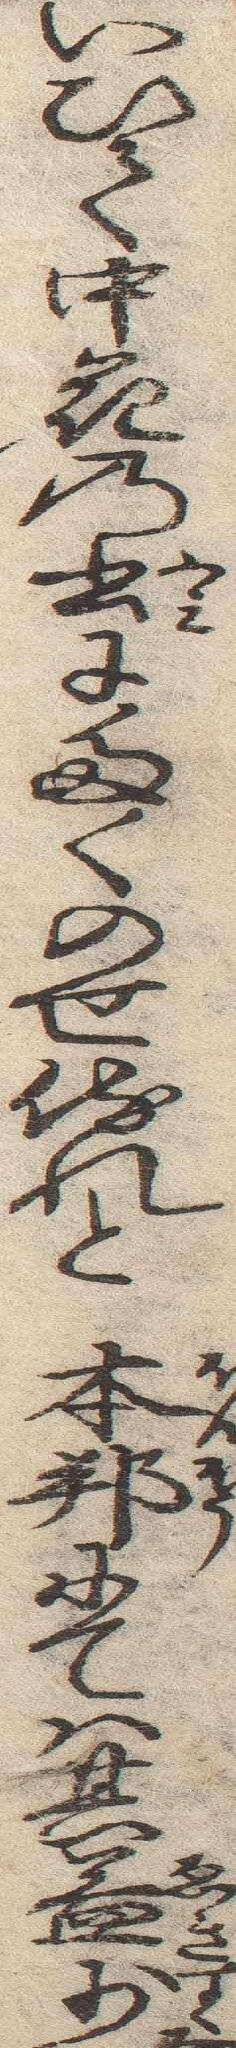いひて中花の書に多くのせ侍れと本邦にては其益少
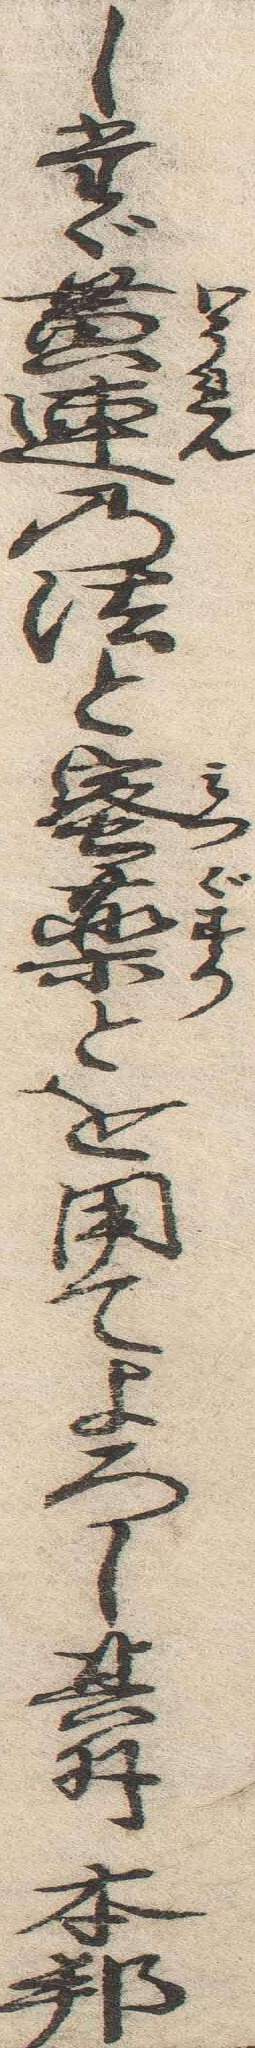したゞ黄連の法と蜜薬とを用てよろし其外本邦
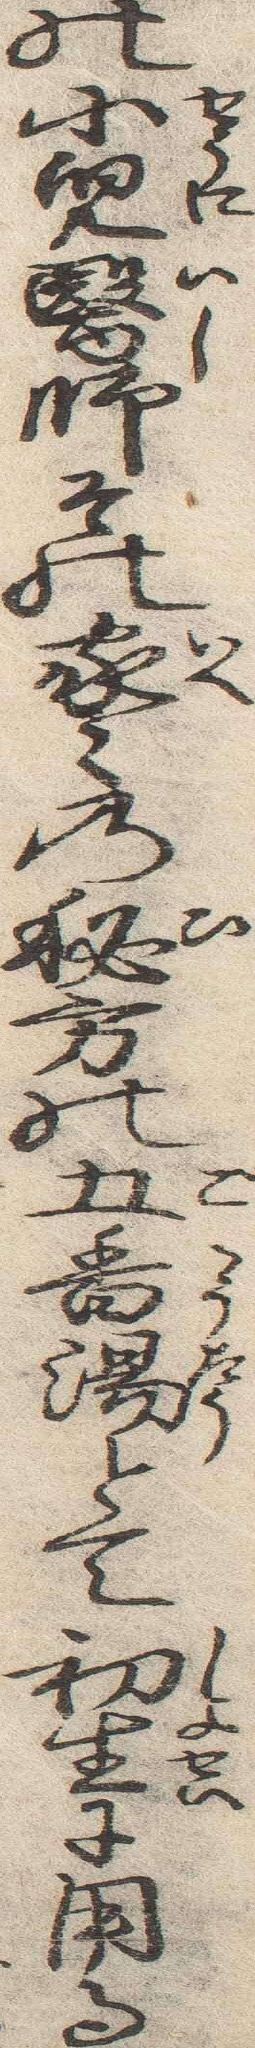の小児醫師その家〻の秘方の五香湯とて初生に用る
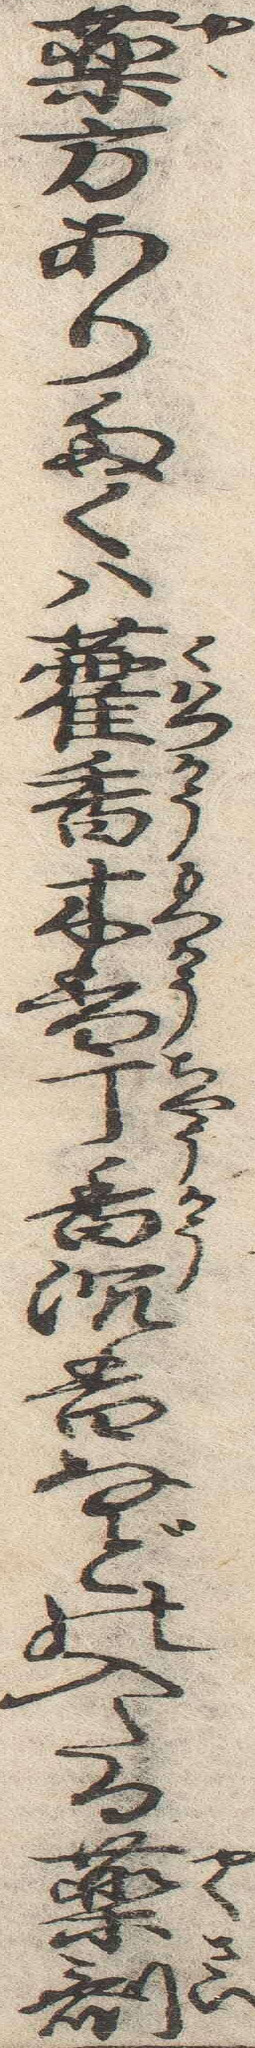薬方あり多くは藿香木香丁香沈香などの入たる薬剤
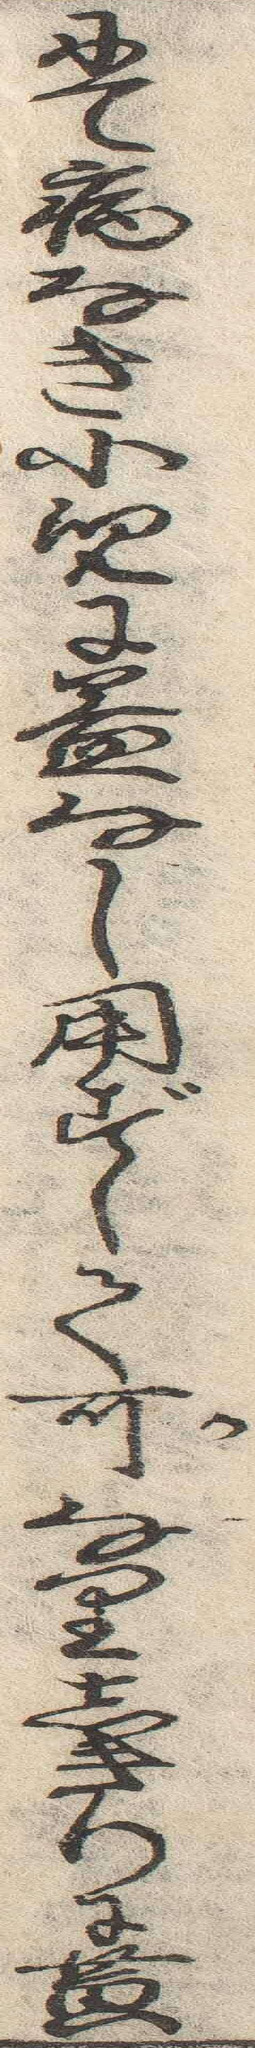にて病なき小児に益なし用ずして可なりしきりに黄
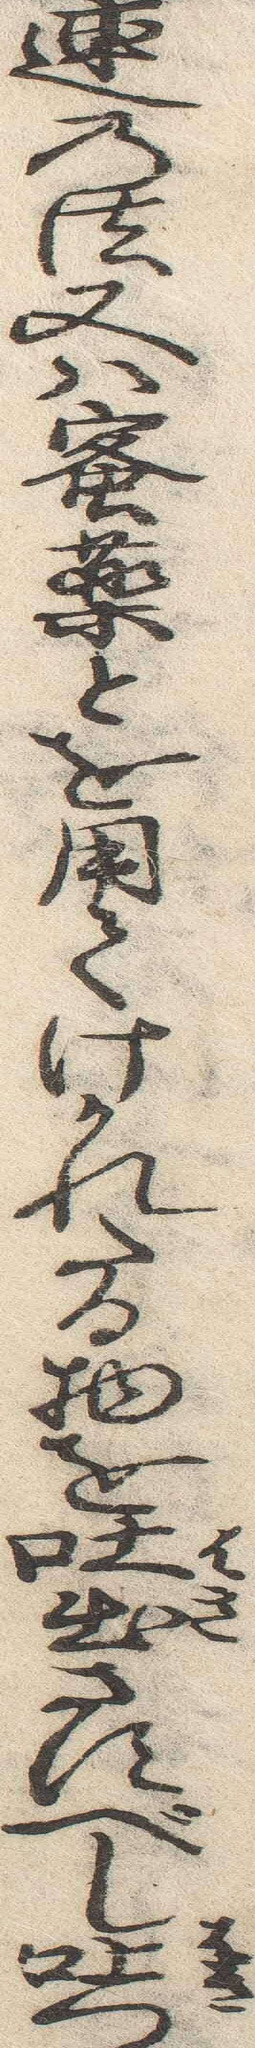連の法又は蜜薬とを用てけかれたる物を吐出さすべし吐つ
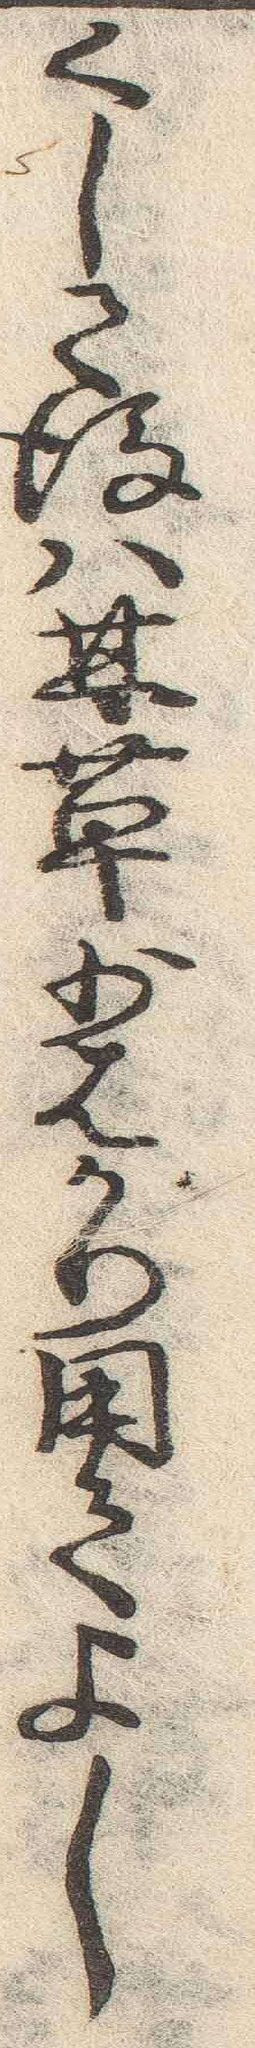くして後は甘草少はかり用てよし
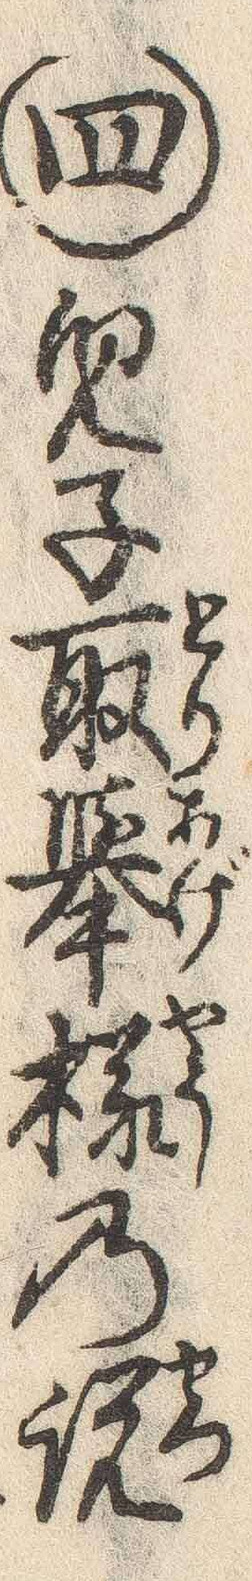㊃児子取擧様の説
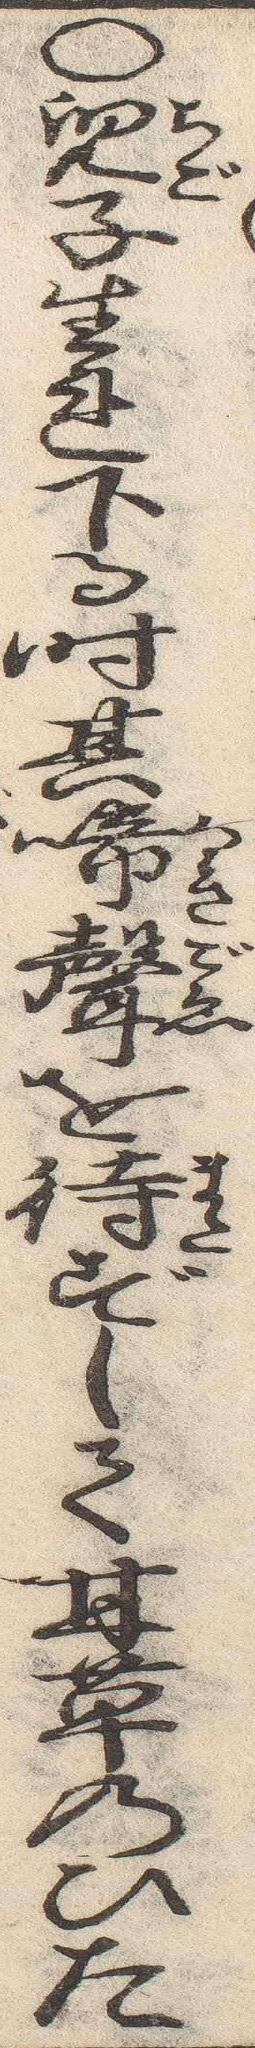◯児子生れ下る時其啼聲を待ずして甘草のひた
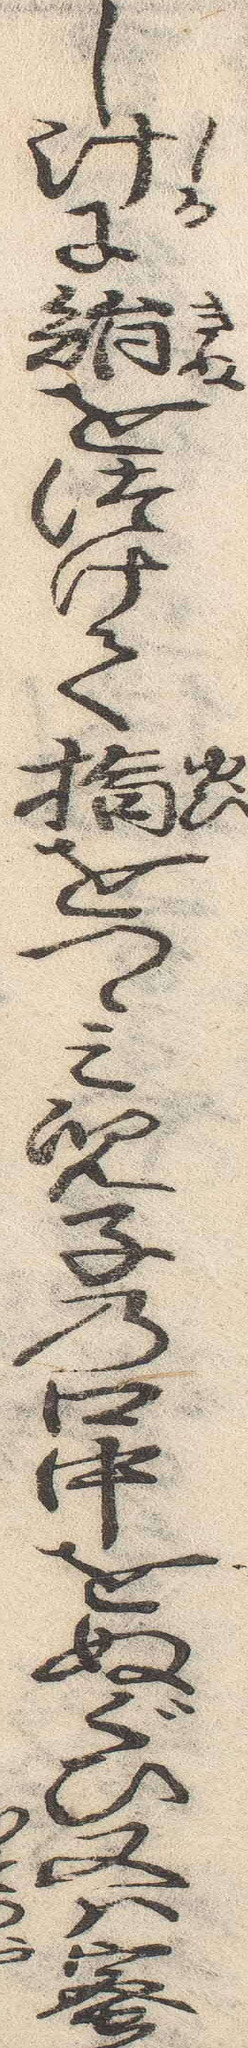し汁に絹をつけて指をつゝみ児子の口中をぬぐひ又は蜜
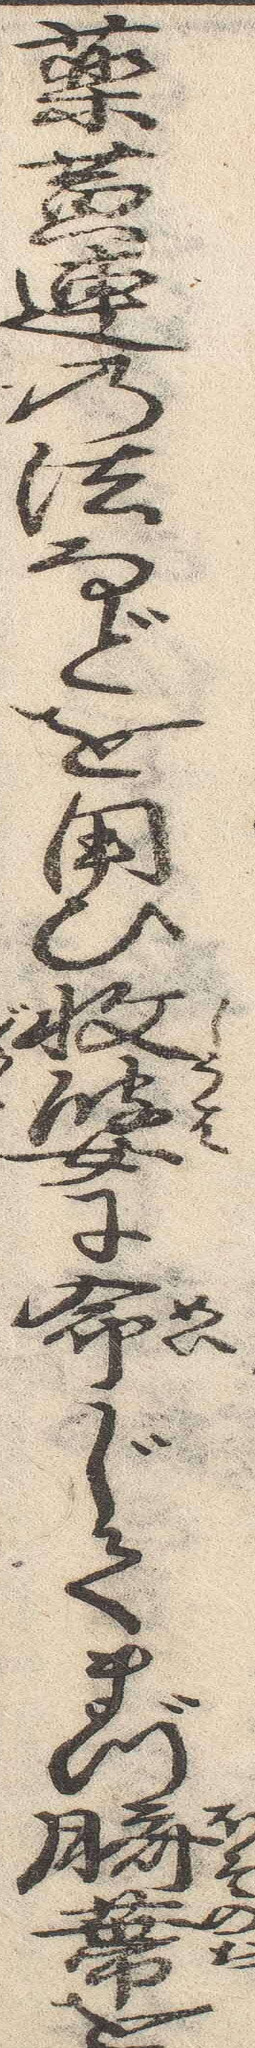薬黄連の法などを用ひ収婆に命じてまづ臍蔕を
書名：小児必用養育草
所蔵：東京学芸大学附属図書館 国文学研究資料館
